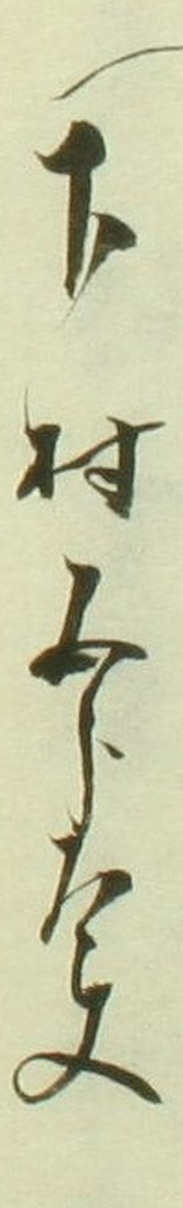下村五郎太夫
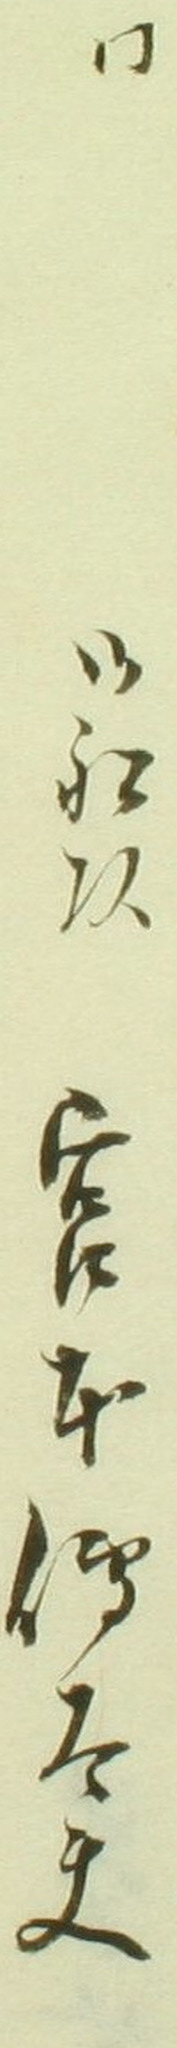同御船頭宮本伝太夫
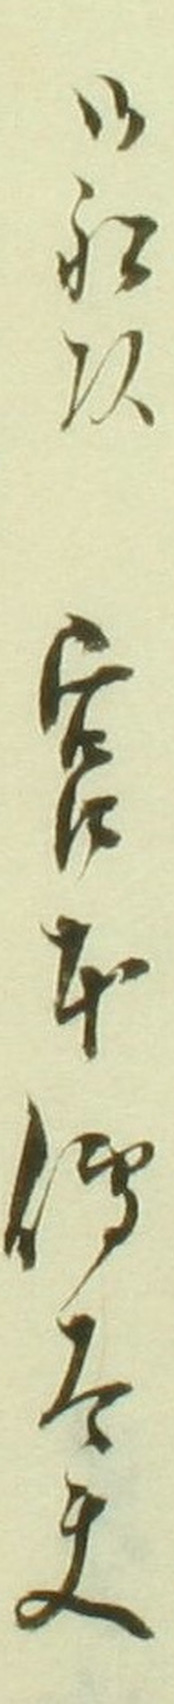同御船頭宮本伝太夫
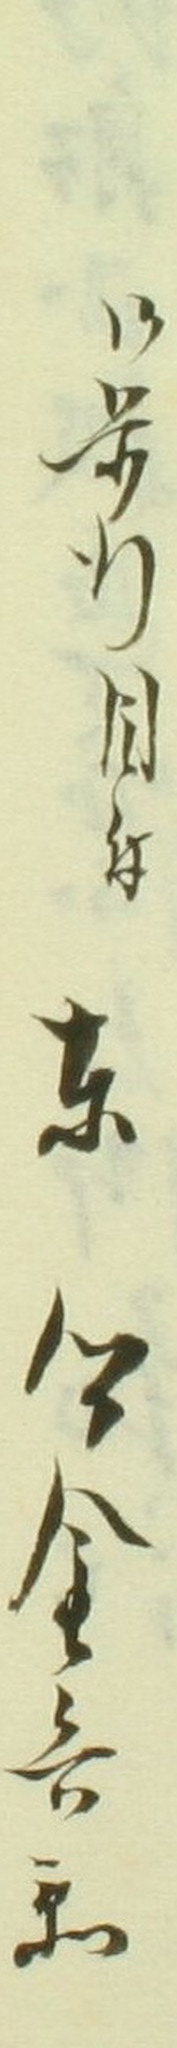同御歩行目付東郷金兵衛
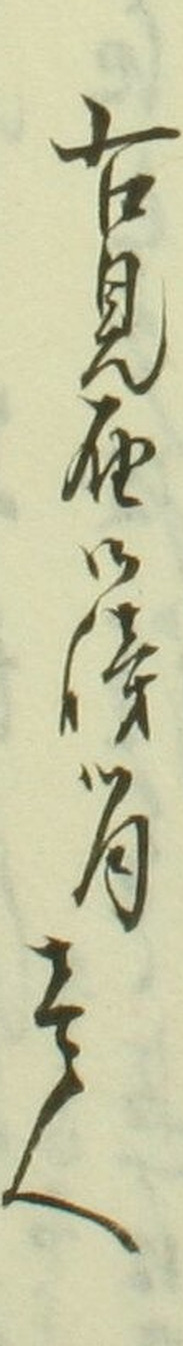右見届御傍留壱人
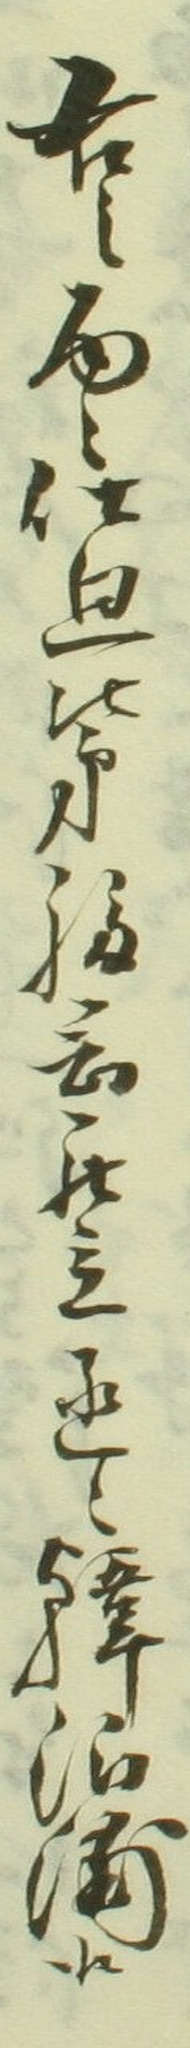右之面々仕廻次第福岡罷立逐々韓泊浦江
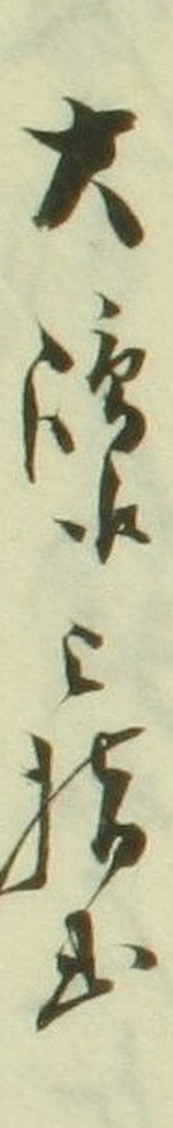大嶋江被指出
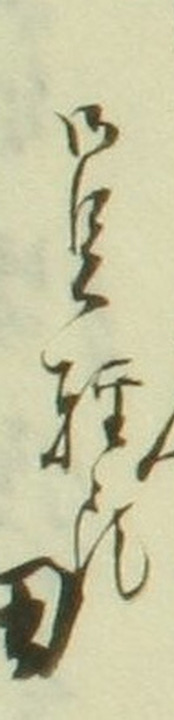御足軽頭
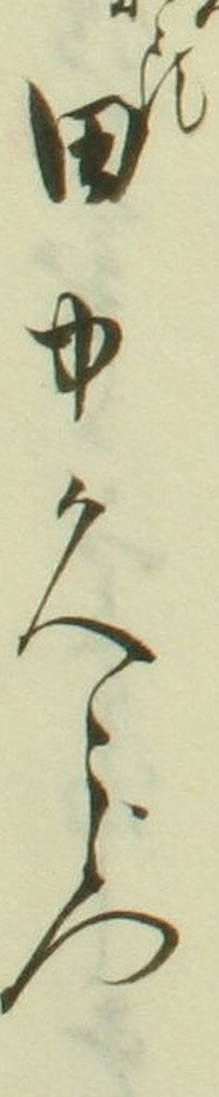田中久右衛門
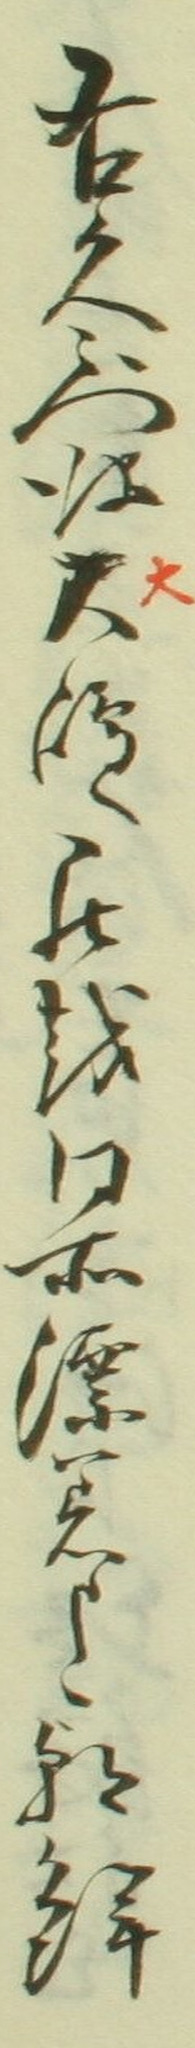右久右衛門儀嶋江罷越同所漂着申候朝鮮
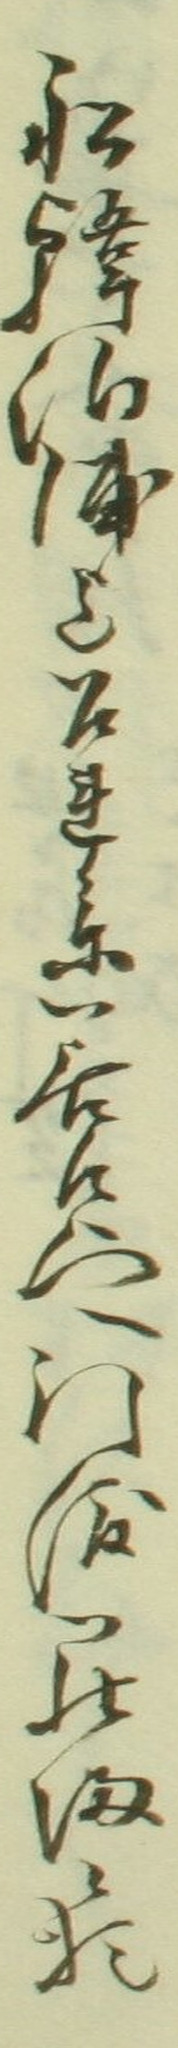船韓泊浦迄召連参善左衛門へ引渡罷帰候様
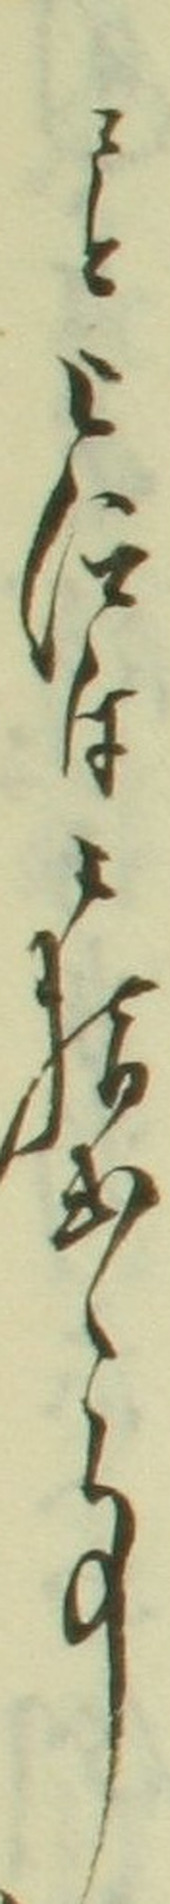ニと被仰付被指出候事

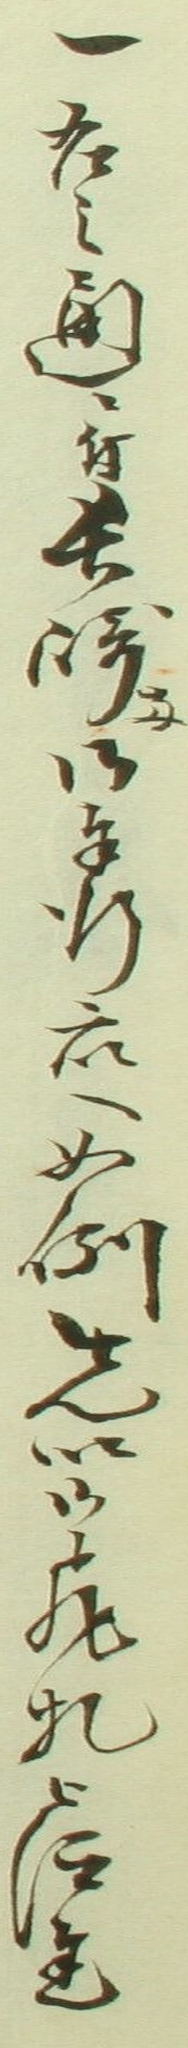一右之通ニ付長崎両御奉行衆へ如例先以御飛札被仰達
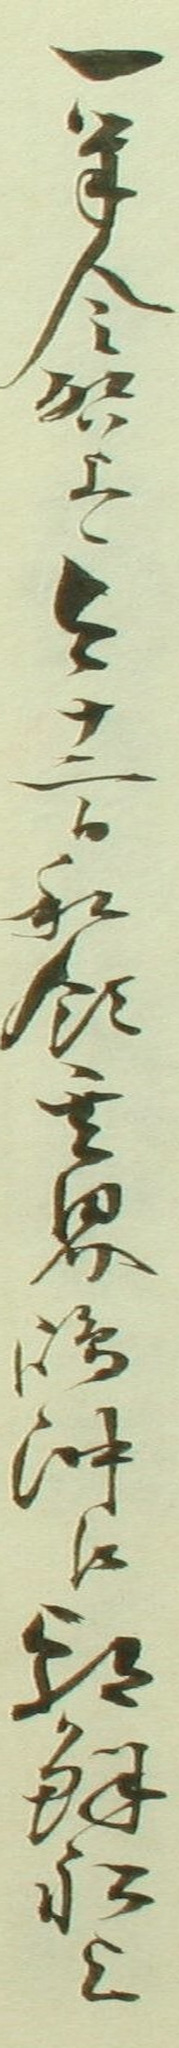一筆令啓上候今十二日私領玄界嶋沖江朝鮮船と
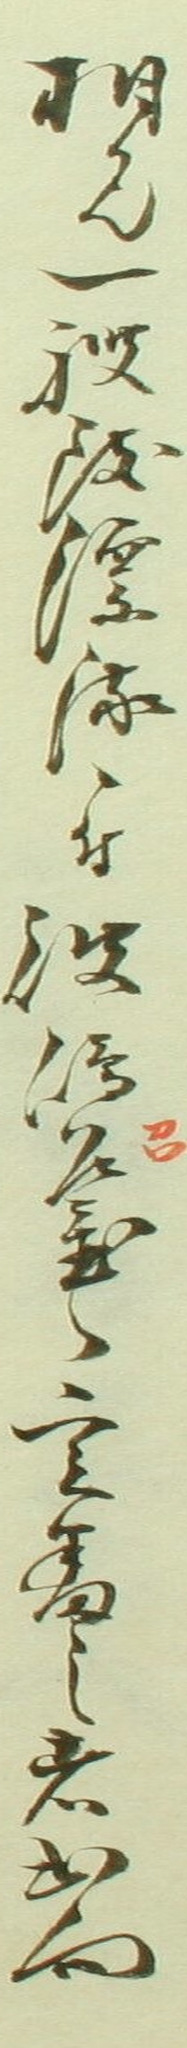相見一艘致漂流候付彼嶋差置候定番之者出向
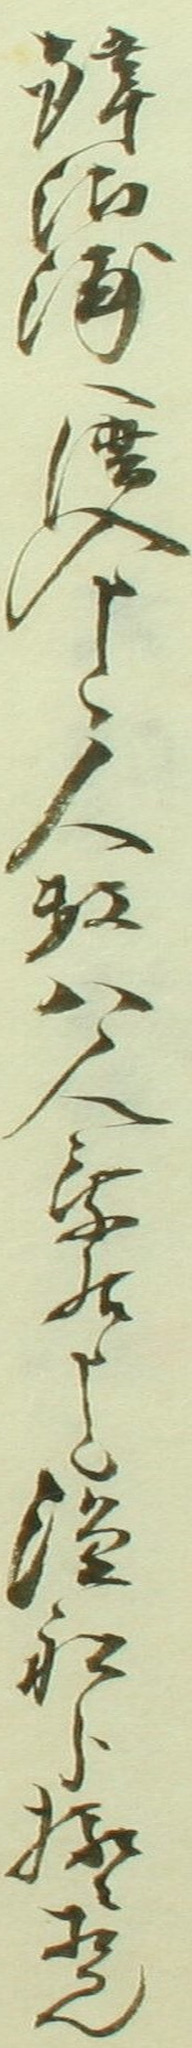韓泊浦へ漕入申候人数八人乗居申候漁船之様ニ相見
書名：異国船漂着記
